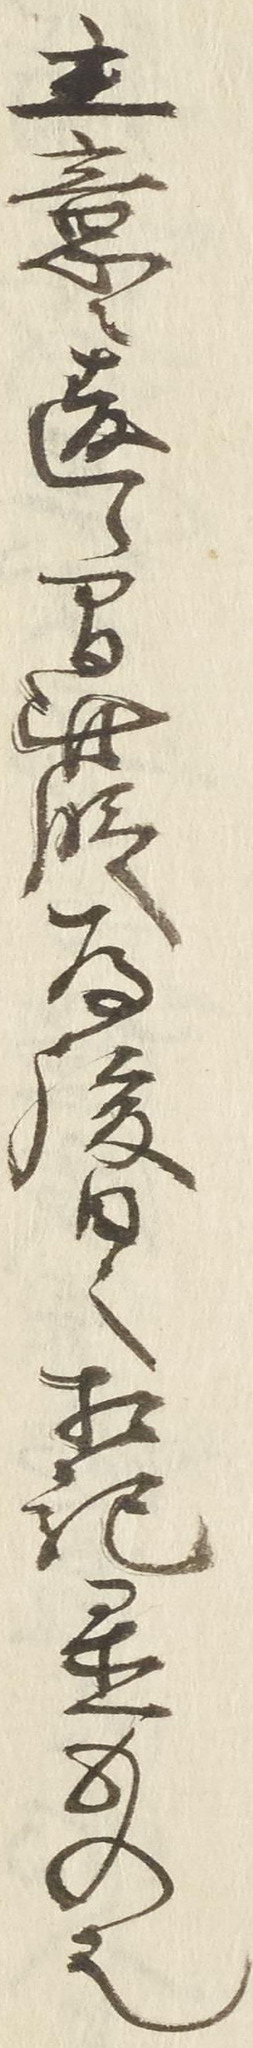立意に違候間此段為後日の相記置もの也
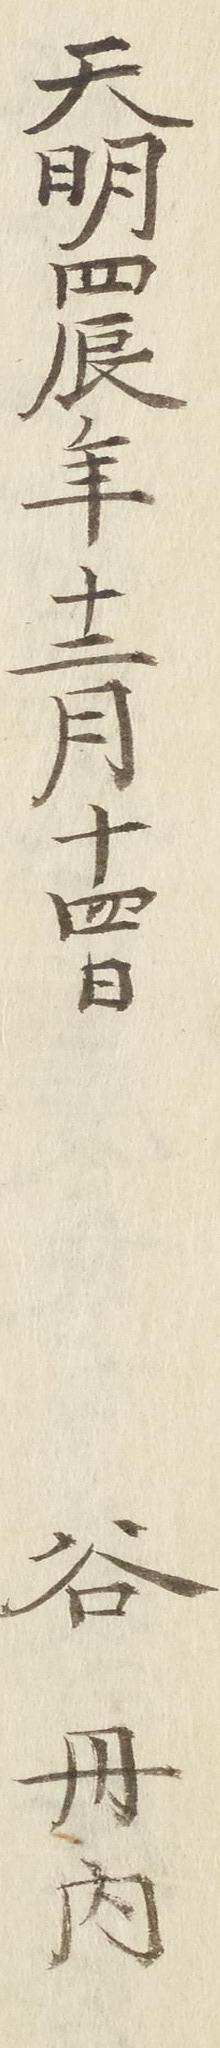天明四辰年十二月十四日谷丹内
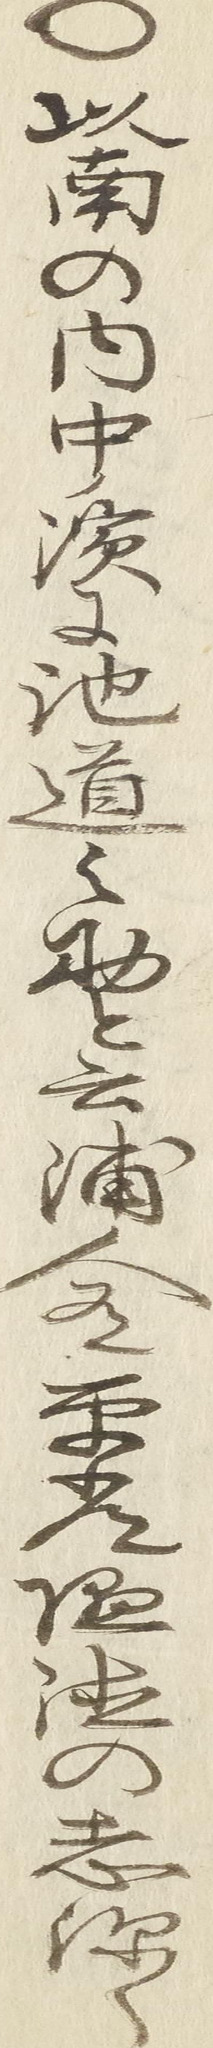〇以南の内中浜に池道之助と云浦人有平常隠徳の志深く
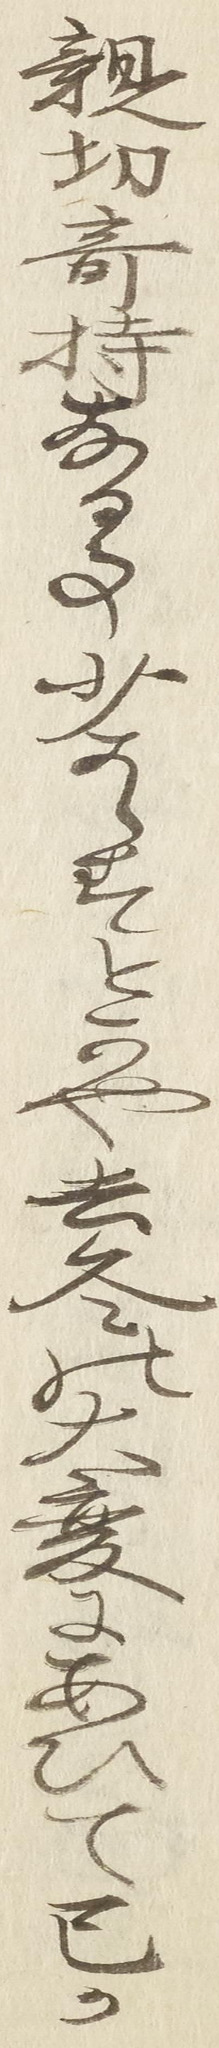親切奇特なる事少なからすとかや去冬の大変にあひて己か
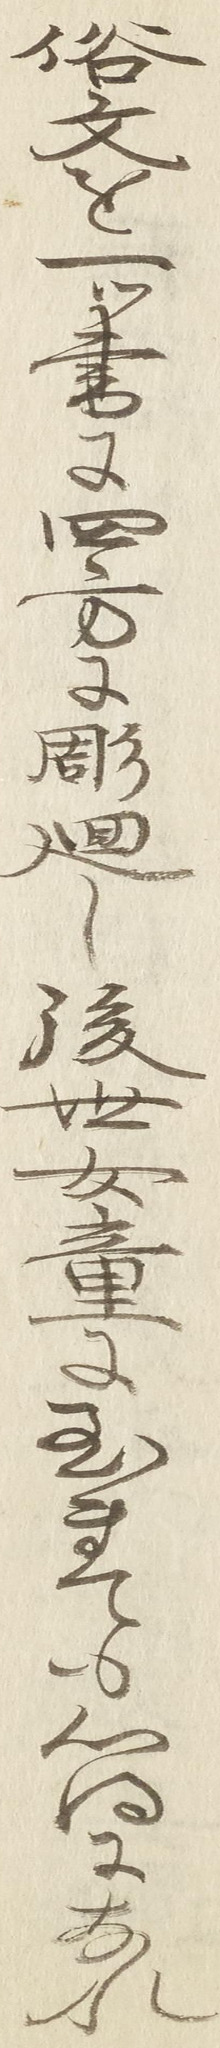俗文を一つ書に四方に彫回し後世女童に至まても心向になれ
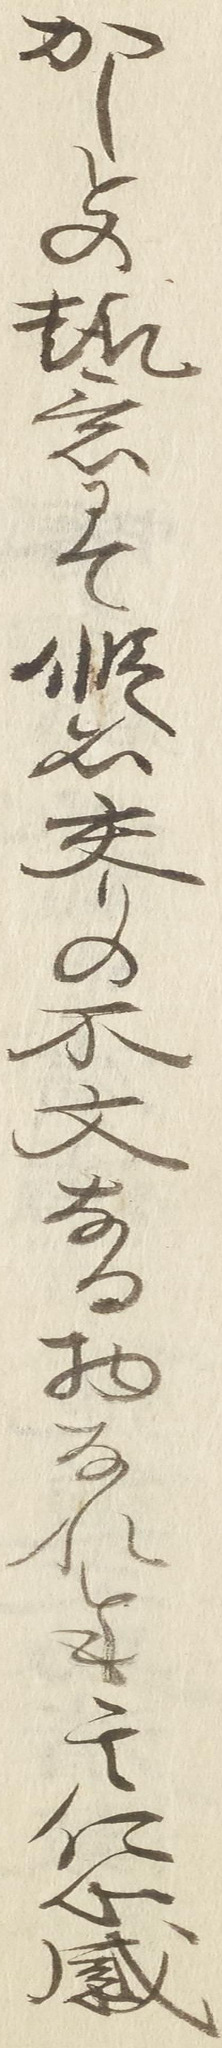かしとの趣意にて仮名交りの不文なる物なれとも其仁心感
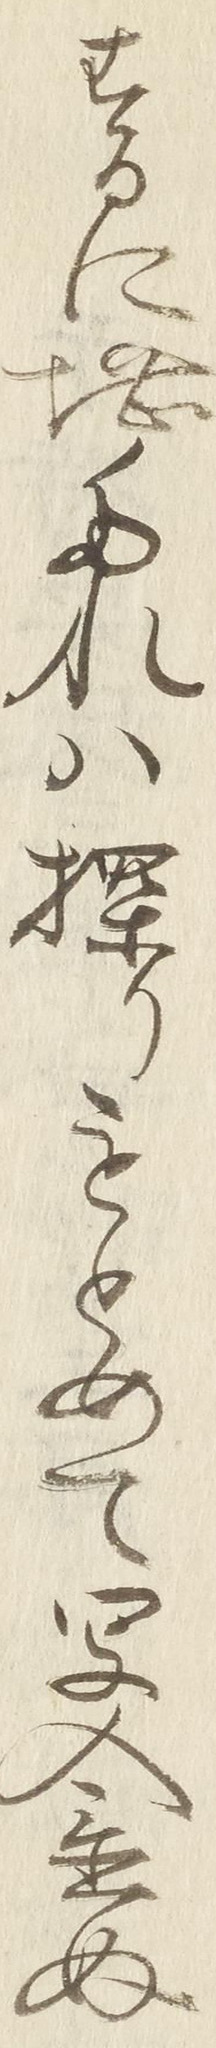するに堪たれは探りもとめて写入置ぬ
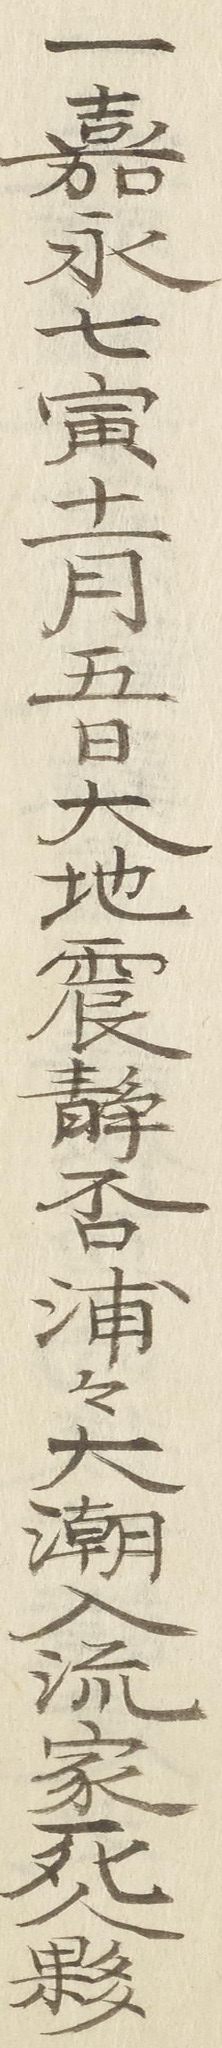一嘉永七寅年十一月五日大地震静否浦々大潮入流家死人夥
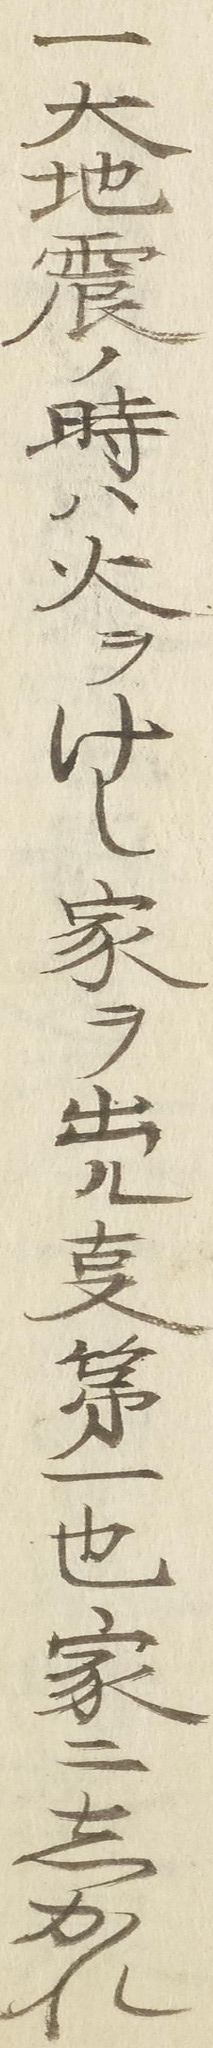一大地震の時は火をけし家を出る事第一也家にしかれ

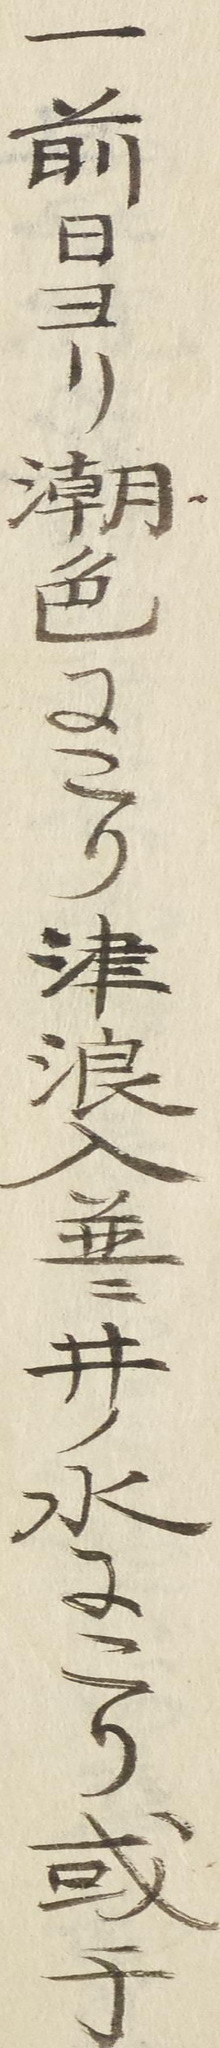一前日より潮色にこり津浪入並に井の水にこり或干
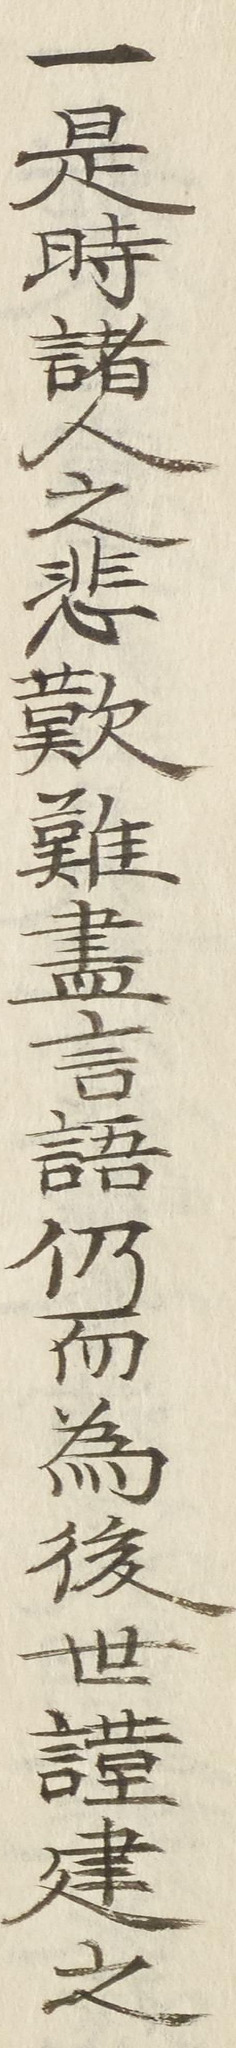一是時諸人之悲歎難盡言語仍て為後世謹建之
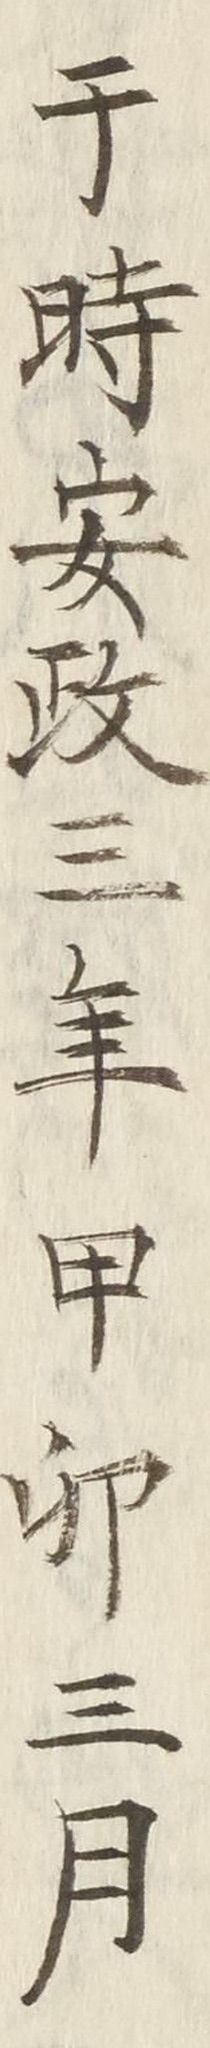于時安政三年甲卯三月
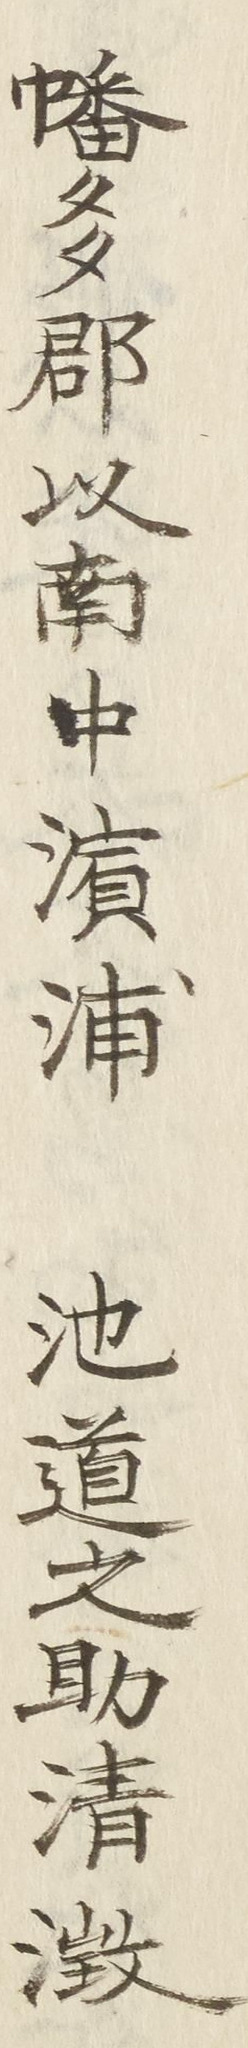幡多郡以南中浜浦池道之助清澂
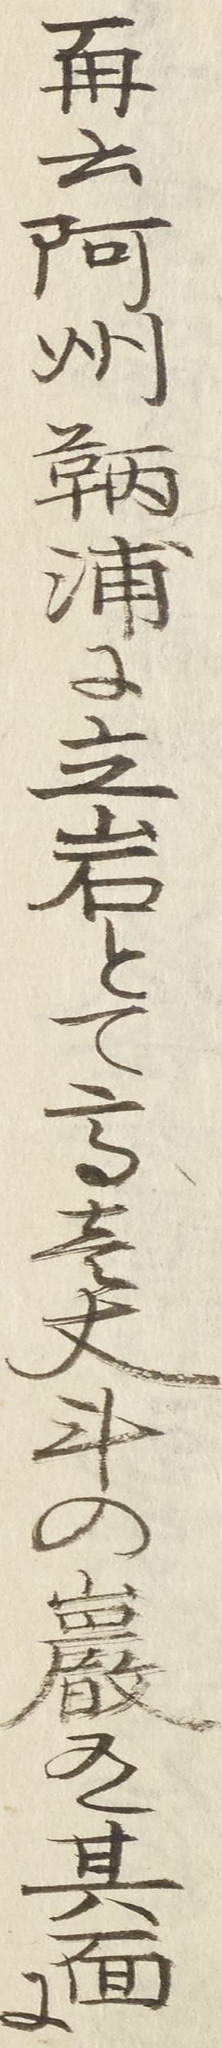再云阿州鞆浦に立岩とて高壱丈斗の巌有其面に
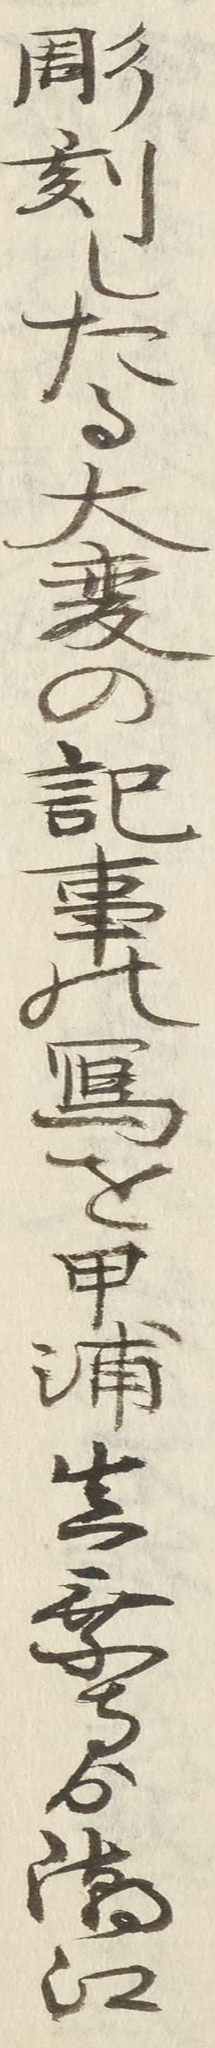彫刻したる大変の記事の写を甲浦真乗寺より潮江
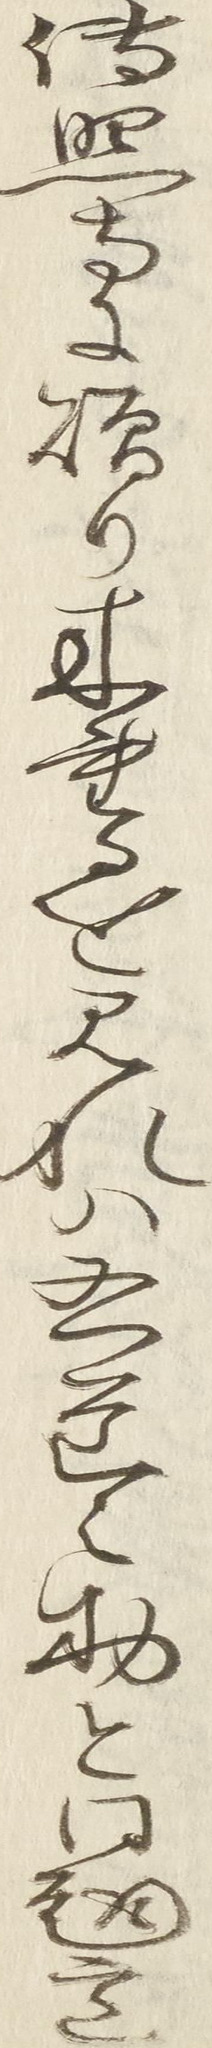伝照寺に贈り来れるを見れは右道之助と同趣意
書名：地震記　上
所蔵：東京大学地震研究所図書室 Earthquake Research Institute Library, The University of Tokyo, JAPAN
